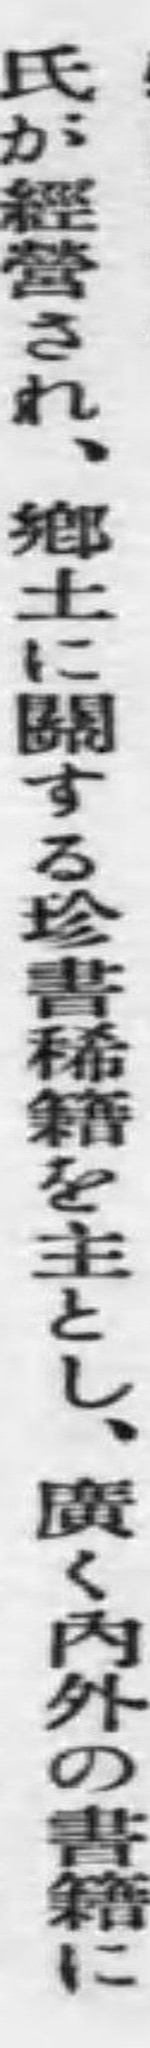氏が経営され、郷土に關する珍書稀籍を主とし、廣く内外の書籍に
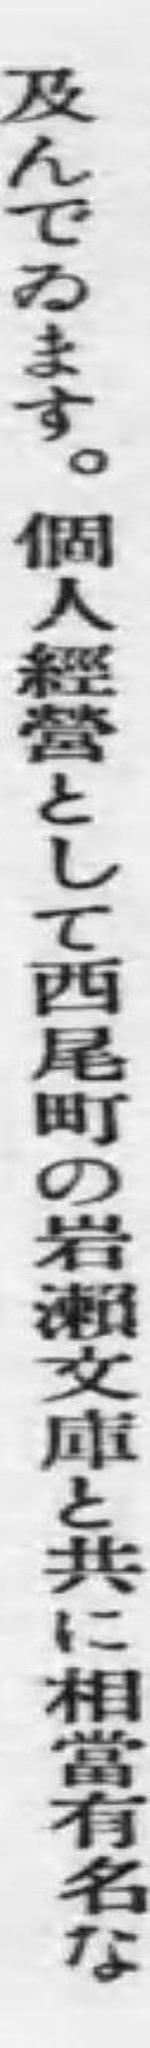及んでゐます。個人経営として西尾町の岩瀬文庫と共に相當有名な
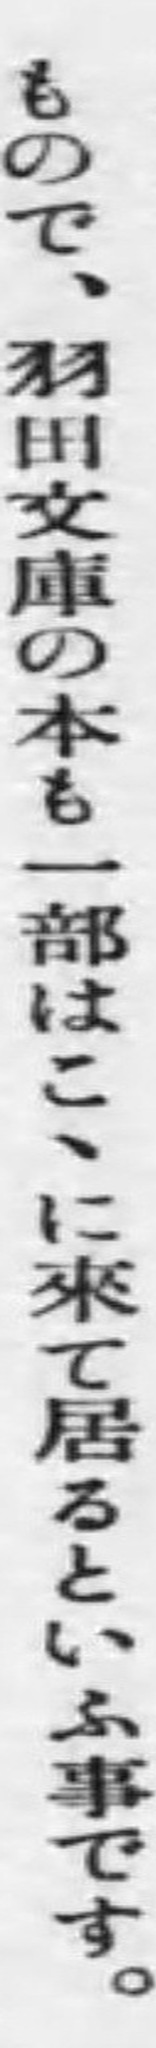もので、羽田文庫の本も一部はこヽに來て居るといふ事です。
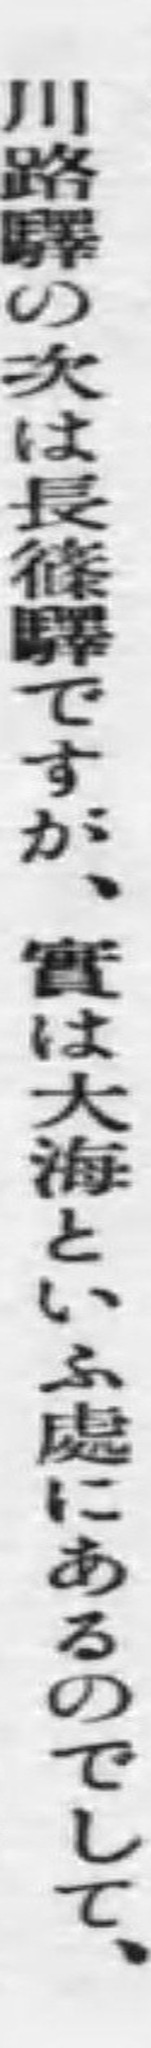川路驛の次は長篠驛ですが、實は大海といふ處にあるのでして、
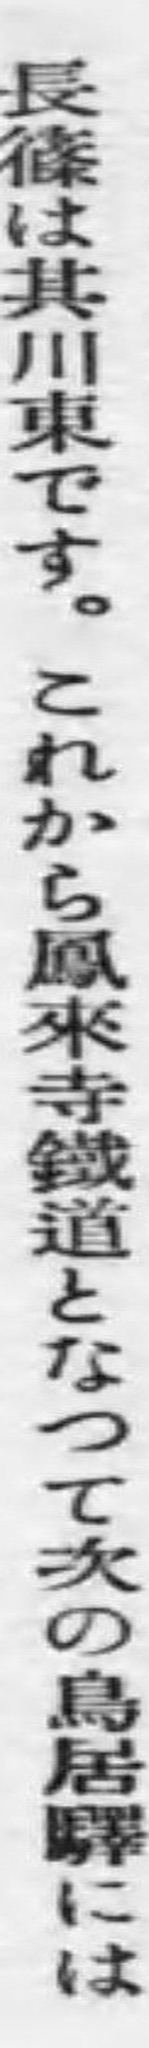長篠は其川東です。これから鳳來寺鐵道となつて次の鳥居驛には
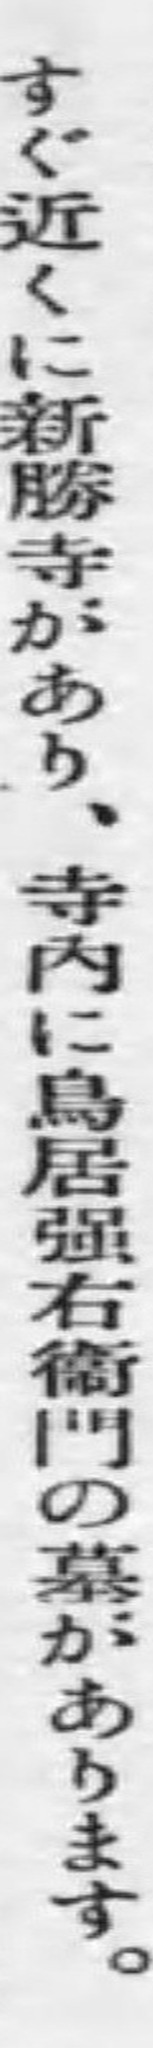すぐ近くに新勝寺があり、寺内に鳥居強右衛門の墓があります。
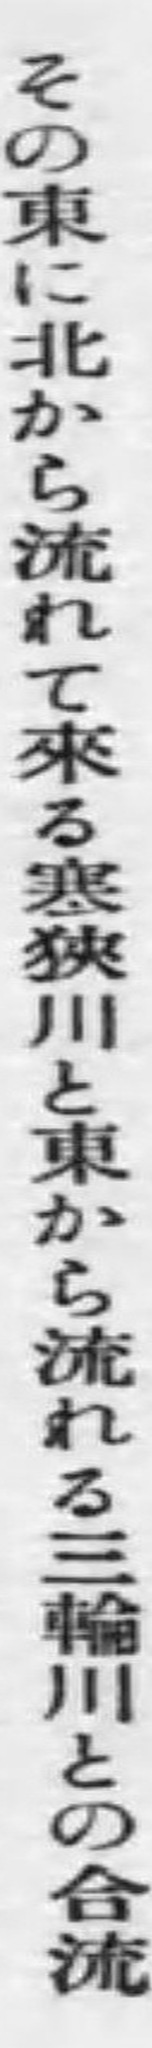その東に北から流れて來る寒狭川と東から流れる三輪川との合流
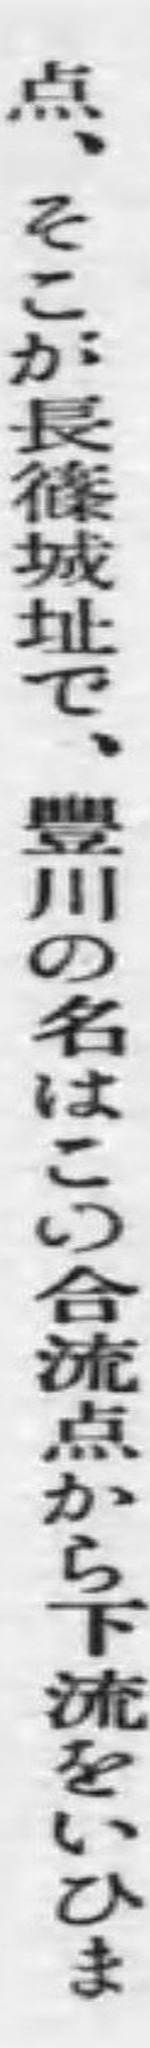点、そこが長篠城址で、豊川の名はこの合流点から下流をいひま
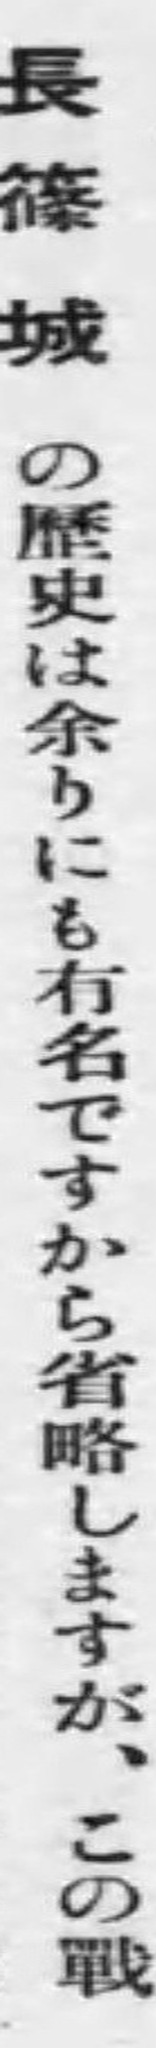長篠城の歴史は余りにも有名ですから省略しますが、この戦
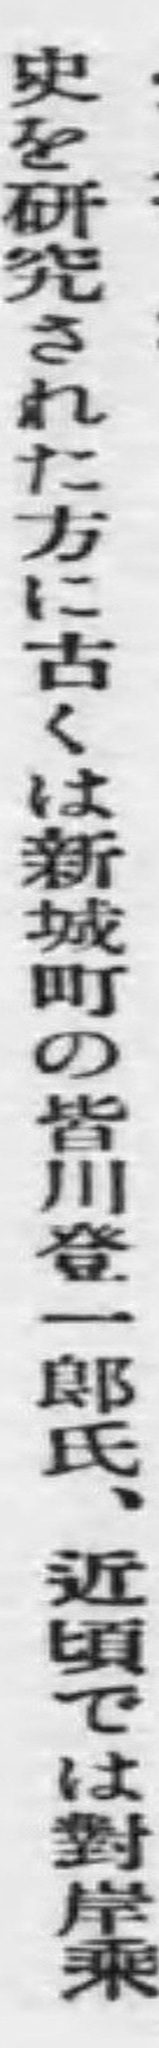史を研究された方に古くは新城町の皆川登一郎氏、近頃では對岸乗
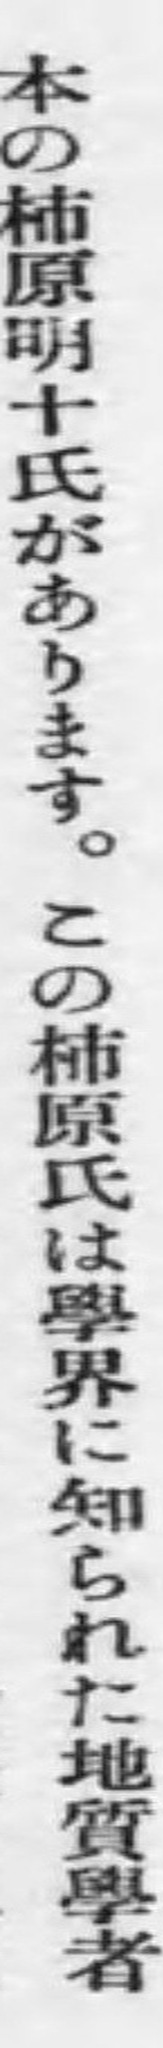本の柿原明十氏があります。この柿原氏は學界に知られた地質學者
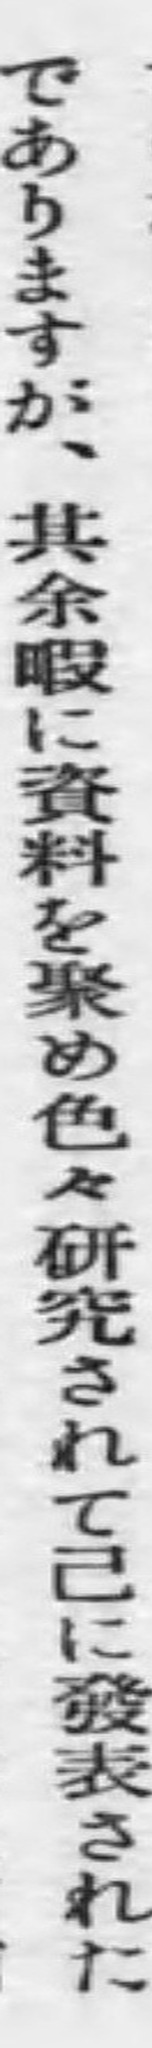でありますが、其余暇に資料を聚め色々研究されて己に發表された
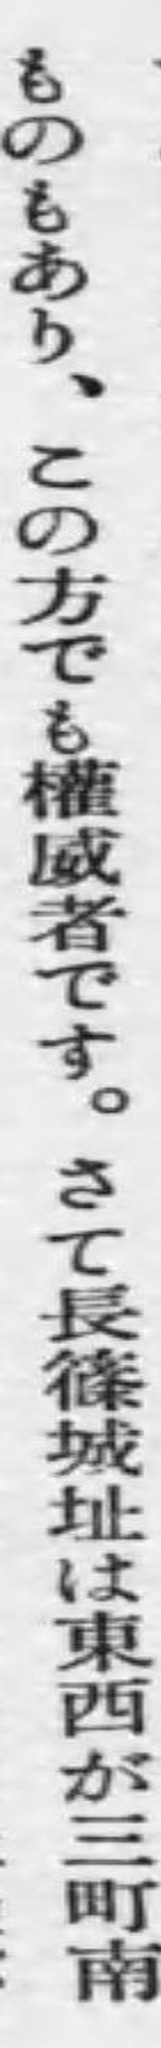ものもあり、この方でも権威者です。さて長篠城址は東西が三町南
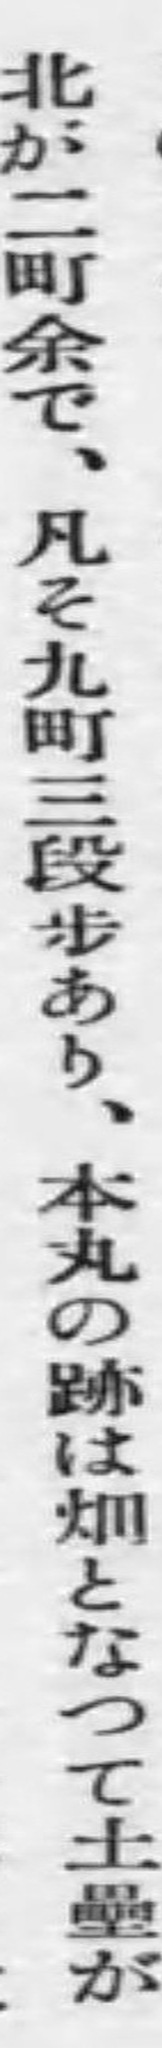北が二町余で、凡そ九町三段歩あり、本丸の跡は畑となつて土壘が
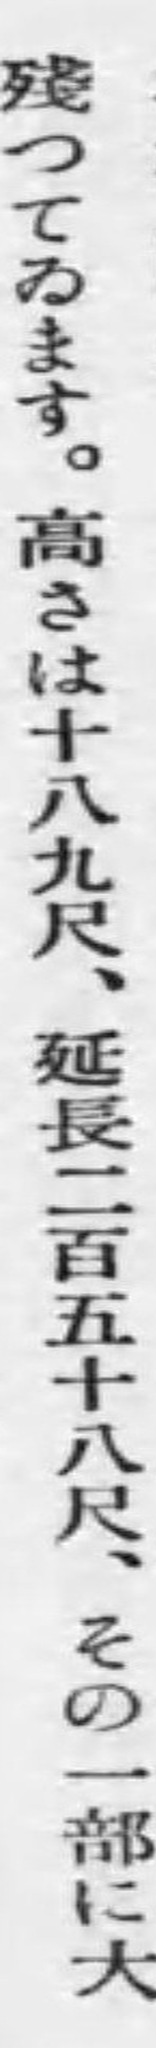殘つてゐます。高さは十八九尺、延長二百五十八尺、その一部に大
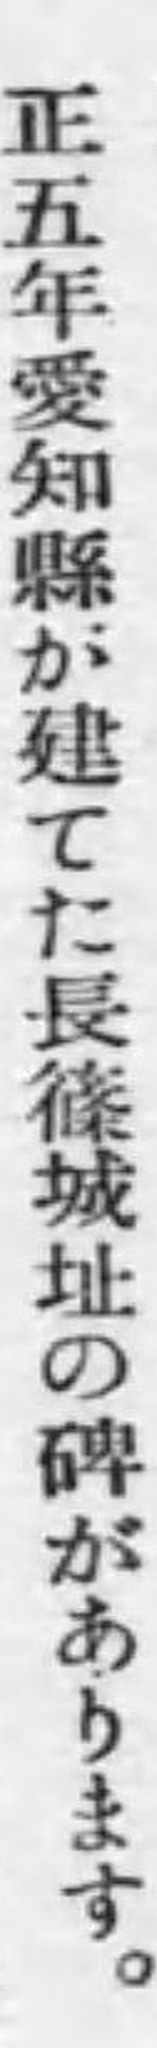正五年愛知縣が建てた長篠城址の碑があります。
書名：東三河道中記 : 豊橋市及其附近案内
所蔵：国立国会図書館 National Diet Library, JAPAN
